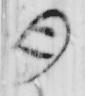月
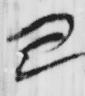己
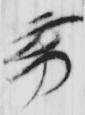亥
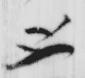之
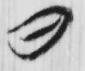日
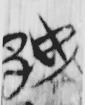○（鄢）
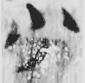少
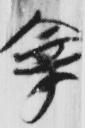宰
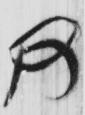尹
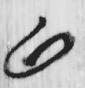㠯（以）
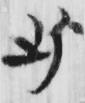此
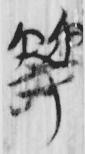等
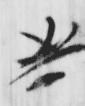至（致）
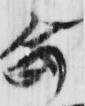命
